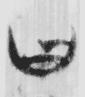曰
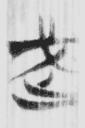武
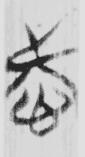{旡心}
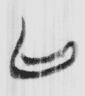㠯（以）
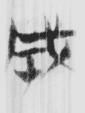成
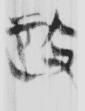政
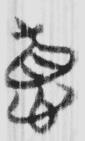惪
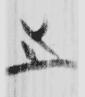之
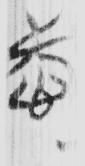{旡心}
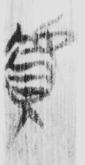{虍貝}
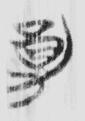勛
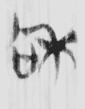和
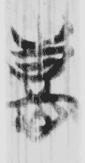𢝫
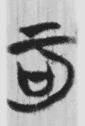可
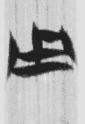用
